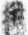金
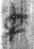才（在）
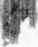長
